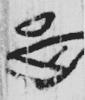是
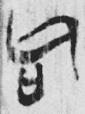句（后）
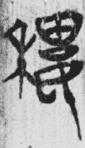稷
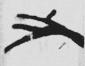之
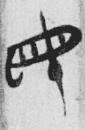母
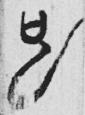也
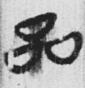厽（三）
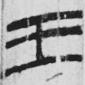王
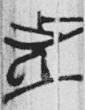者
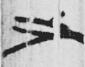之
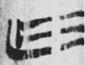乍（作）
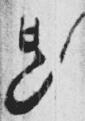也
